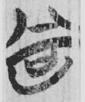甚
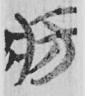○（病）
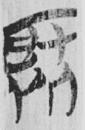聚（驟）
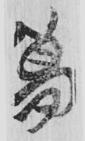夢
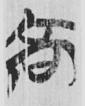高
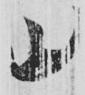山
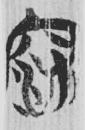深
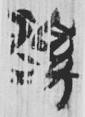溪
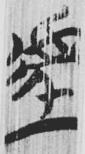○（吾）
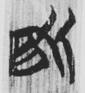所
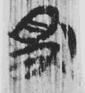𠭁
